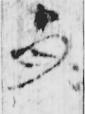十月
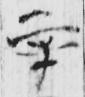辛
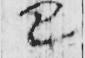巳
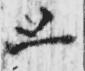之
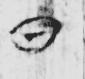日
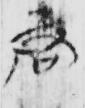君
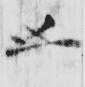之
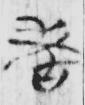耆
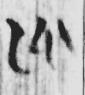州
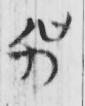加
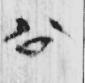公
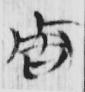周
